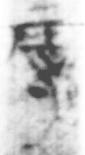○（蒙）
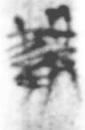○（鞁）
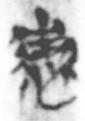○（轡）
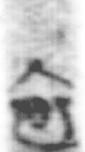哀
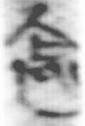裛
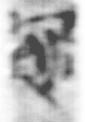所
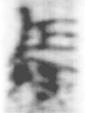馭（御）
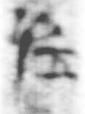○（左）
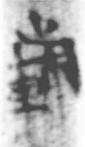○（旆）
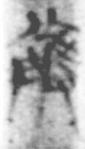雘
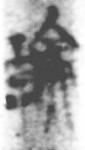輪
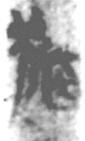弼
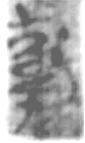韌
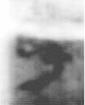革
